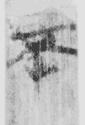不
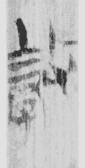{𣪊子}
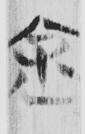余
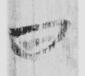日
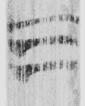三
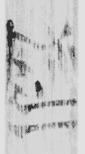{阜朮止}
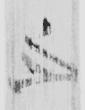之
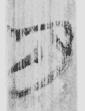夕
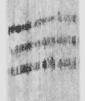三
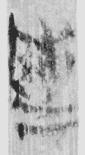{阜朮止}
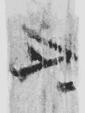之
